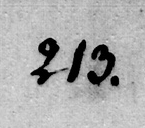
200.
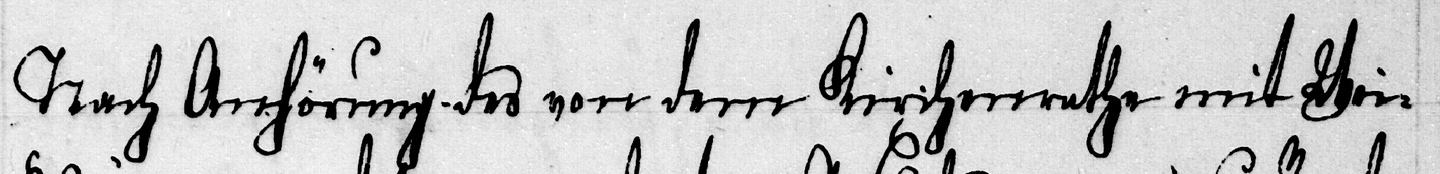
Nach Anhörung des von dem Kirchenrathe mit Wei¬
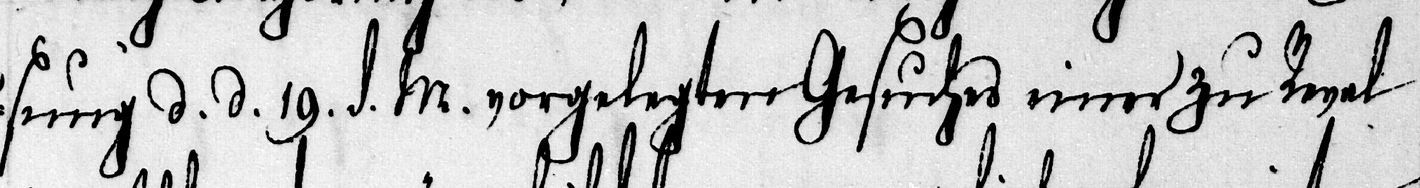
sung d. d. 19. d. M. vorgelegten Gesuchs einer zu Revel
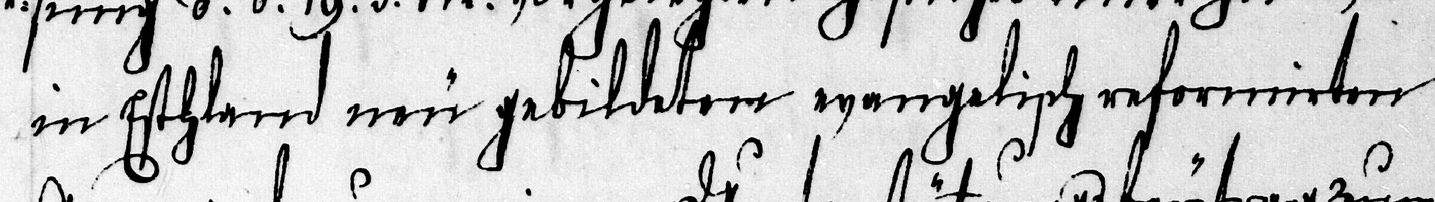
in Esthland neu gebildeten evangelisch reformirten
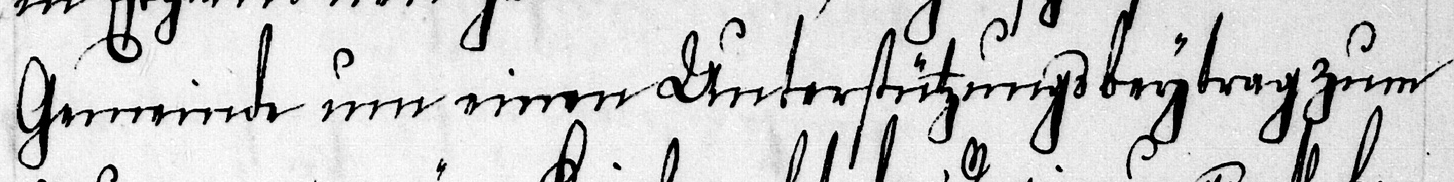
Gemeinde um einen Unterstützungsbeytrag zum
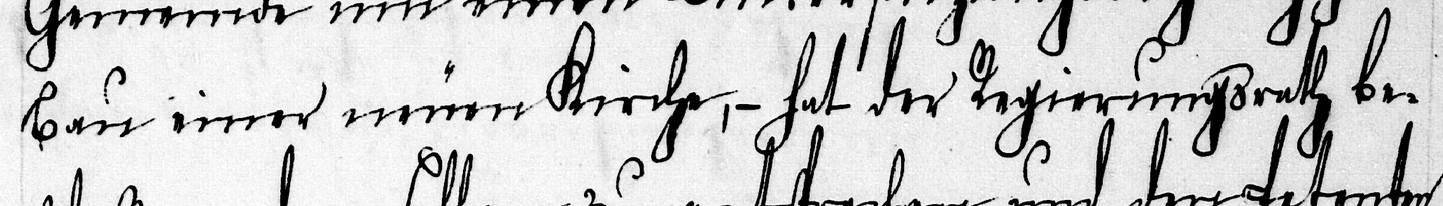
Bau einer neuen Kirche, – hat der Regierungsrath be¬
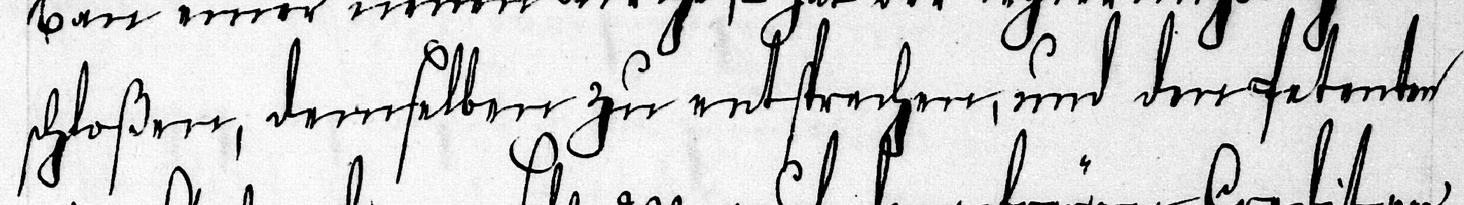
schloßen, demselben zu entsprechen, und den Petenten
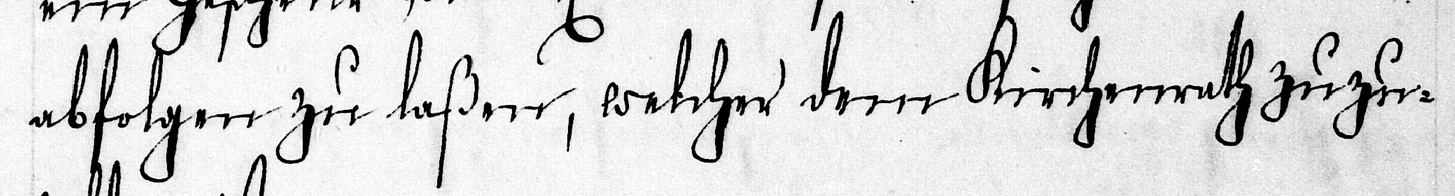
abfolgen zu laßen, welcher dem Kirchenrath zuzus¬
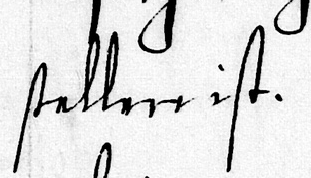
tellen ist.
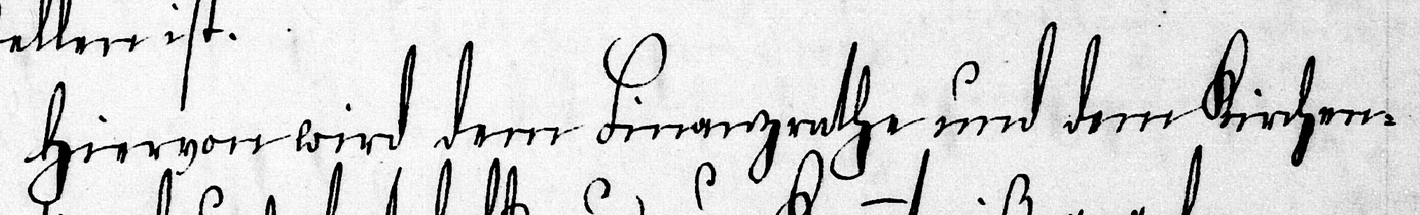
Hiervon wird dem Finanzrathe und dem Kirchen¬
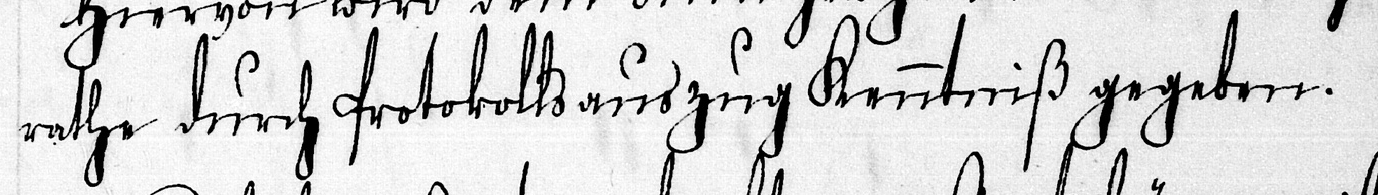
rathe durch Protokollsauszug Kenntniß gegeben.
